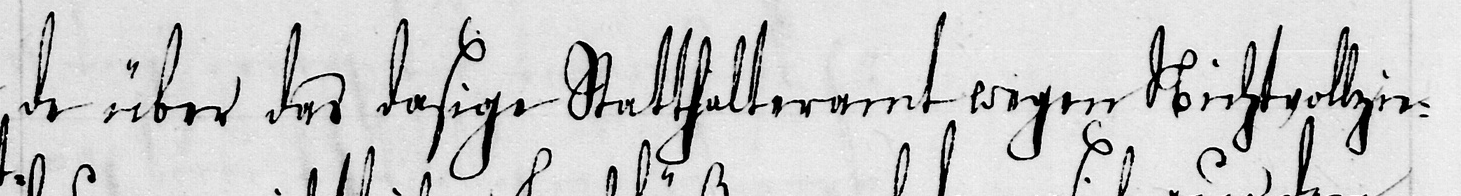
de über das dasige Statthalteramt wegen Nichtvollz¬
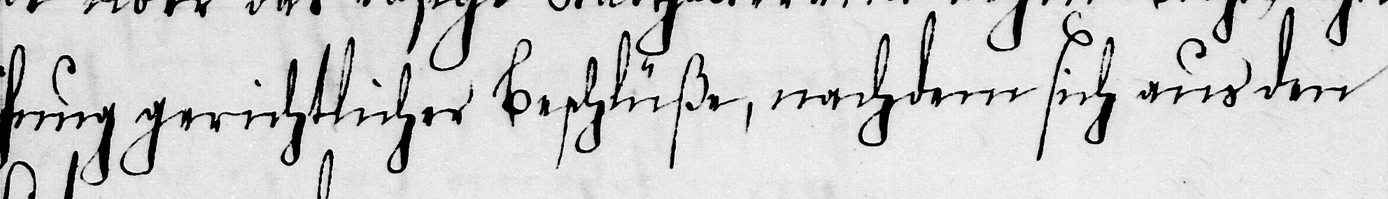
ung gerichtlicher Beschlüße, nachdem sich aus den
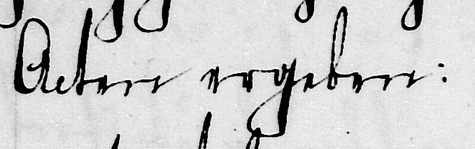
Acten ergeben:
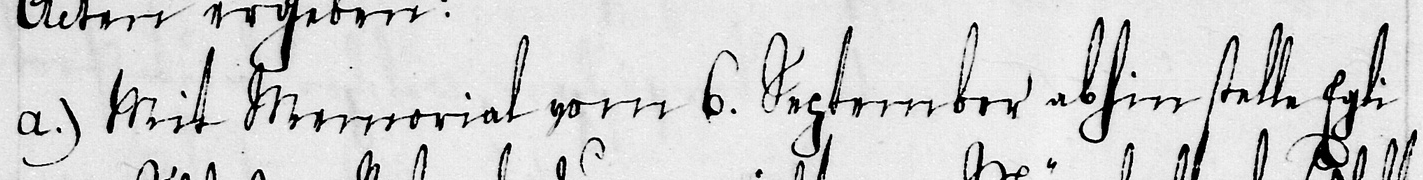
a.) Mit Memorial vom 6. September abhin stelle Egli
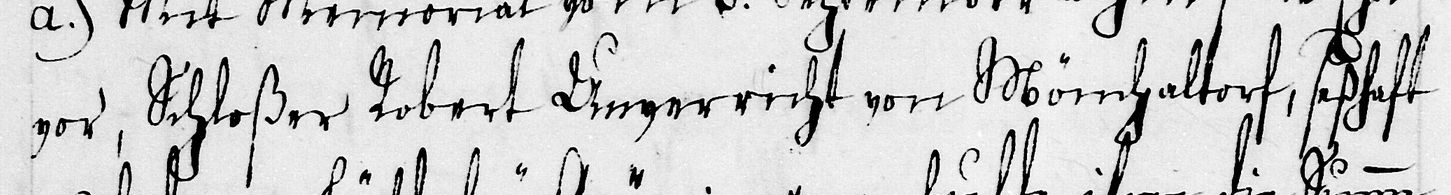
vor, Schloßer Robert Unverricht von Mönchaltorf, seßhaft
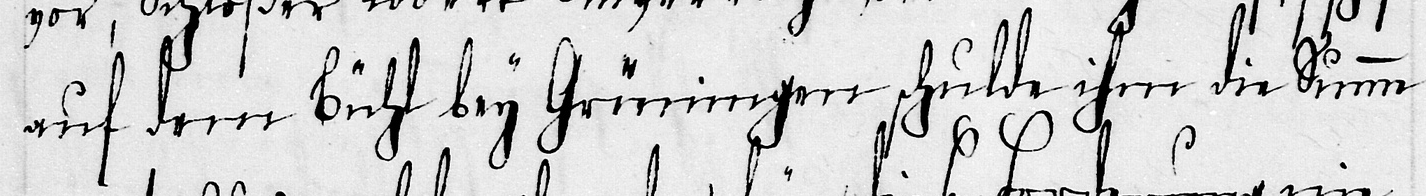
auf dem Bühl bey Grüningen schulde ihm die Summe
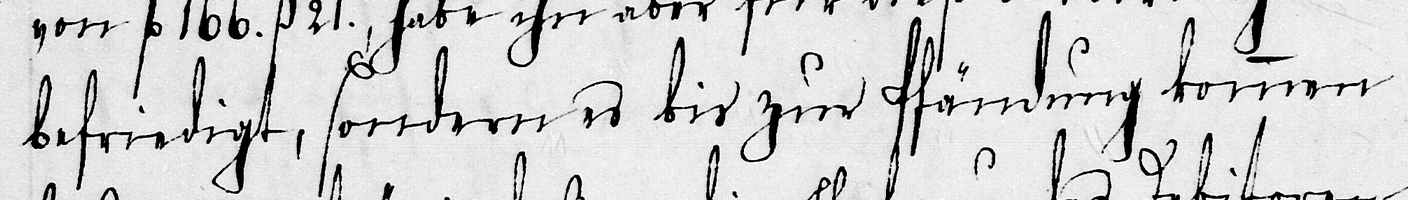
befriedigt, sondern es bis zur Pfändung kommen
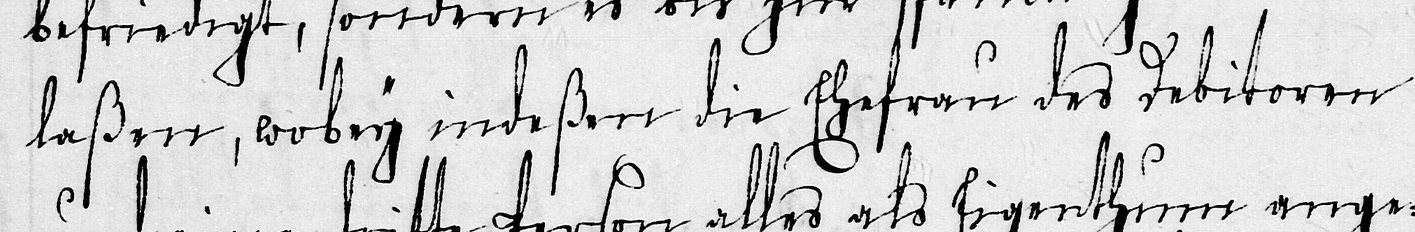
laßen, wobey indeßen die Ehefrau des Debitoren
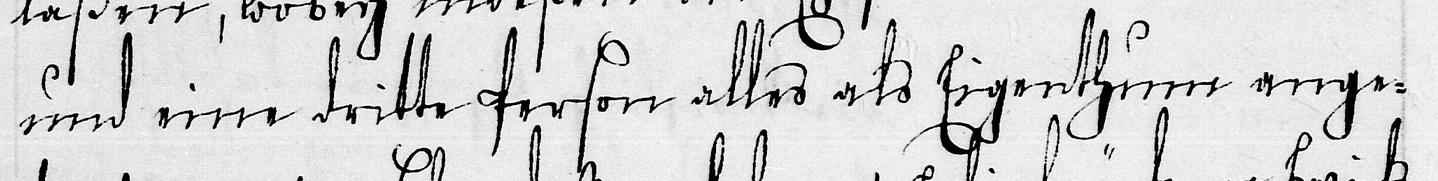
und eine dritte Person alles als Eigenthum ange¬
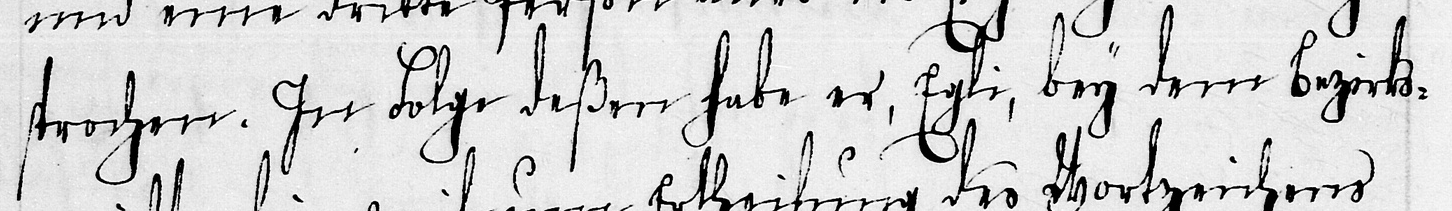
sprochen. In Folge deßen habe er, Egli, bey dem Bezirks¬
